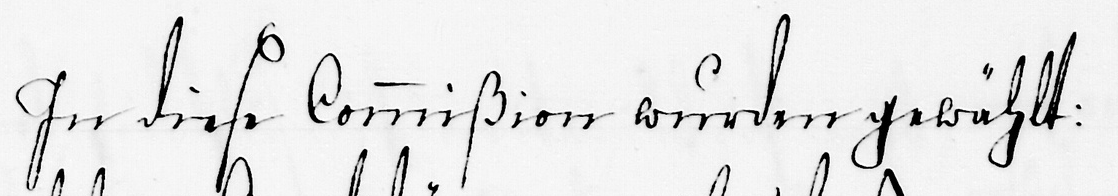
In diese Commißion wurden gewählt:
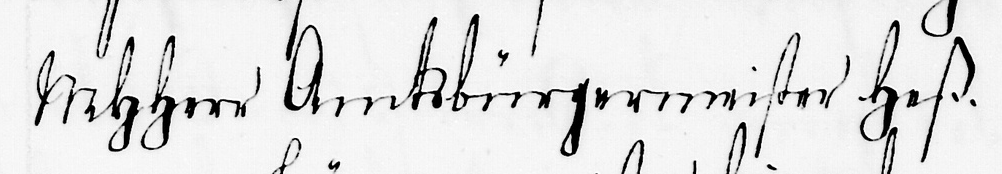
MHHerr Amtsbürgermeister Heß.
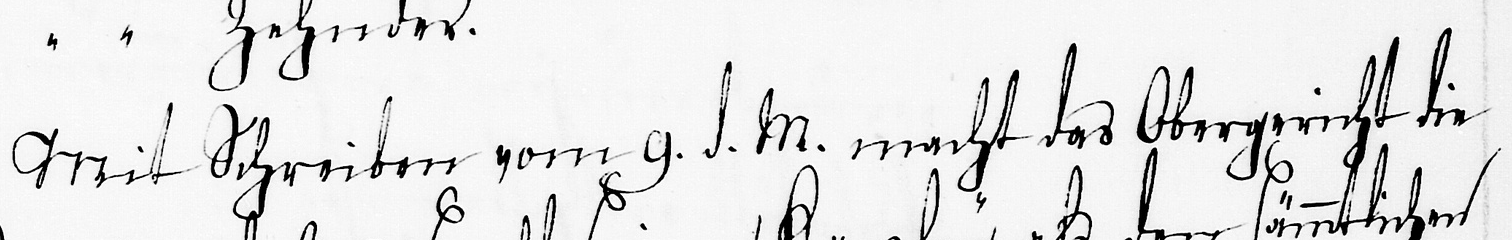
Mit Schreiben vom 9. d. M. macht das Obergericht die
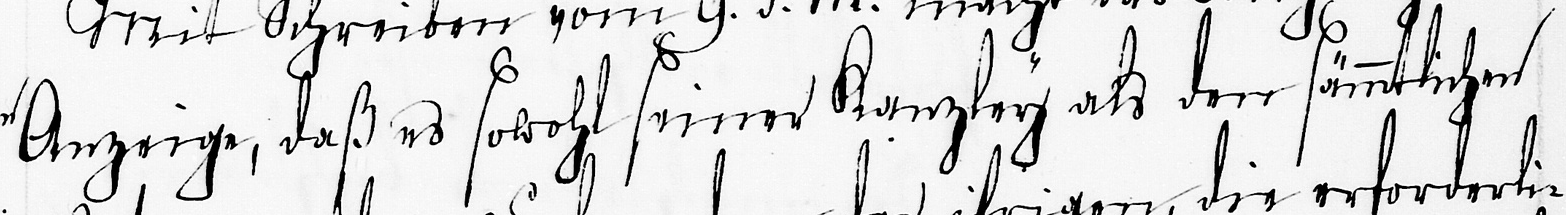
Anzeige, daß es sowohl seiner Kanzley als den sämmtlichen
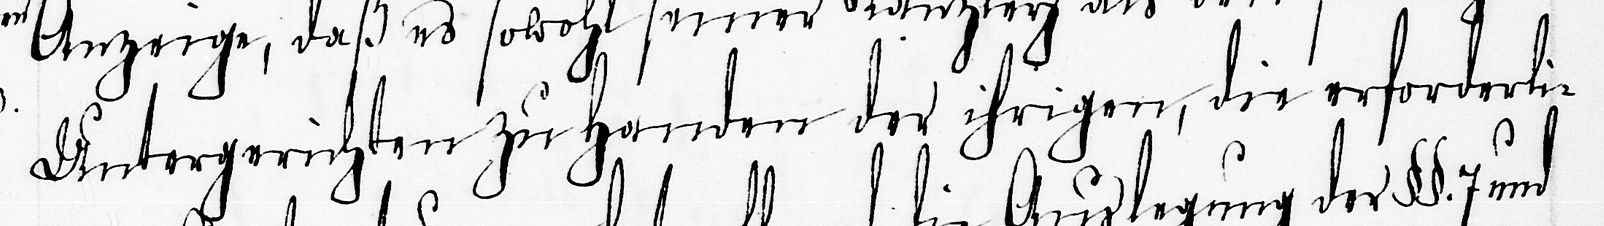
Untergerichten zu Handen der ihrigen, die erforderli¬
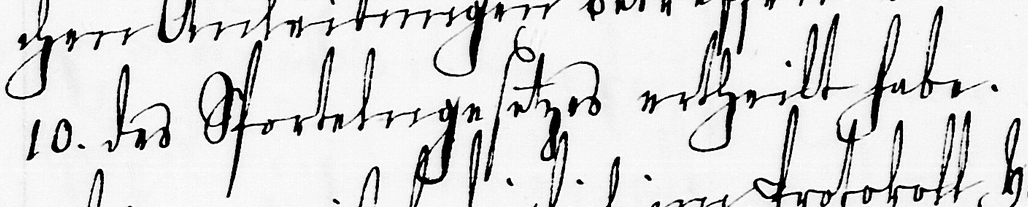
10. des Sportelngesetzes ertheilt habe.
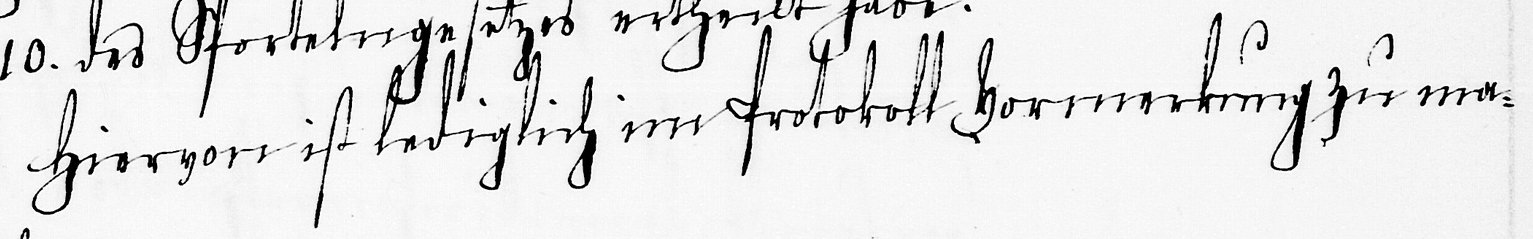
Hiervon ist lediglich im Protokoll Vormerkung zu ma¬
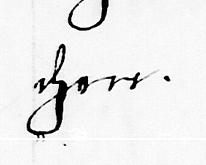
chen.
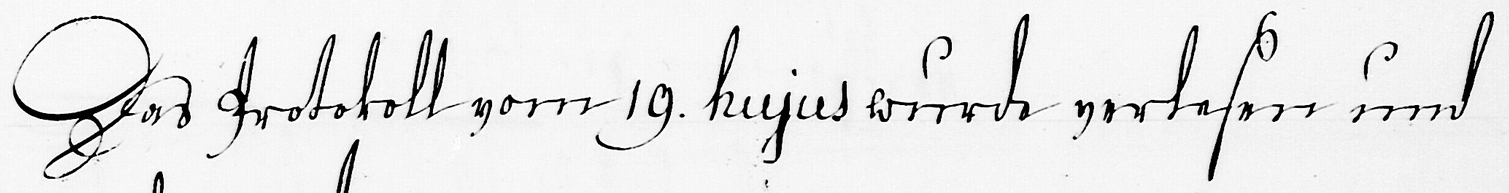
Das Protokoll vom 19. hujus wurde verlesen und
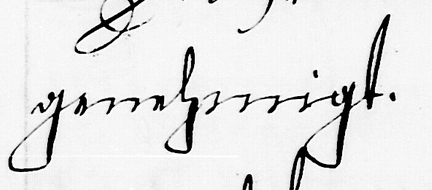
genehmigt.
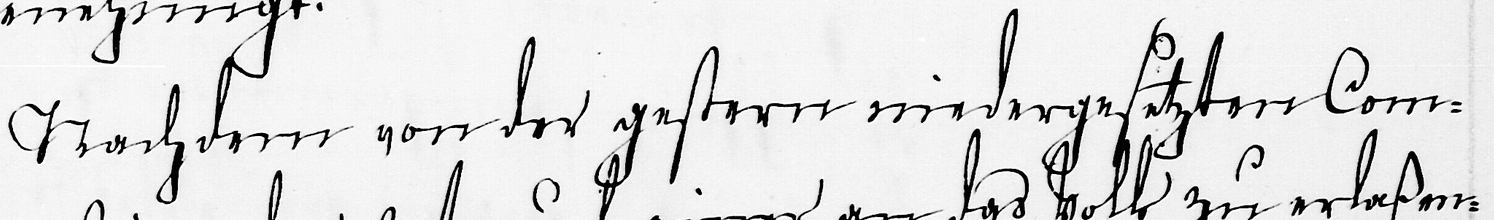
Nachdem von der gestern niedergesetzten Com¬
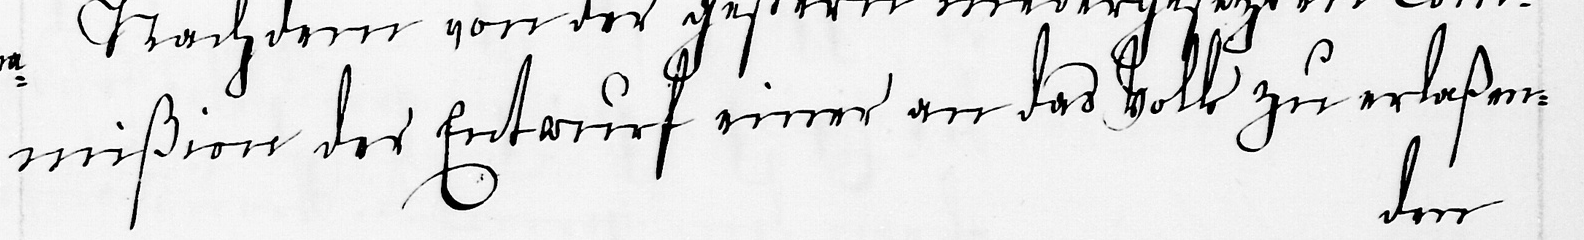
mißion der Entwurf einer an das Volk zu erlaßen-
